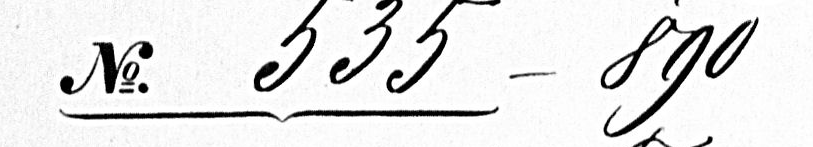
N° 535 - 890
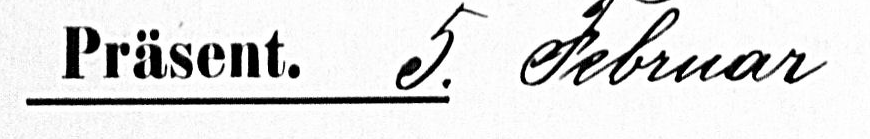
Präsent. 5. Februar
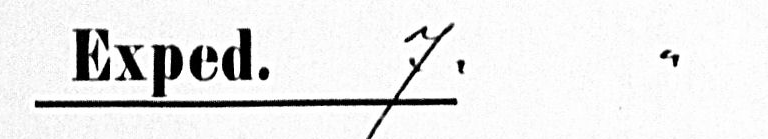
Exped. 7. Februar
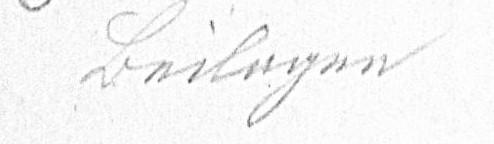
Beilagen
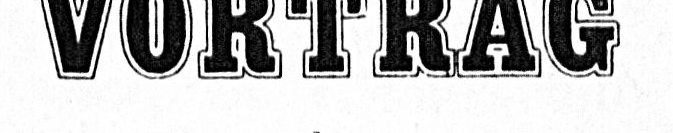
VORTRAG
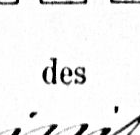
des
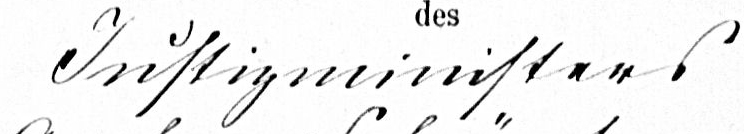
Justizministers
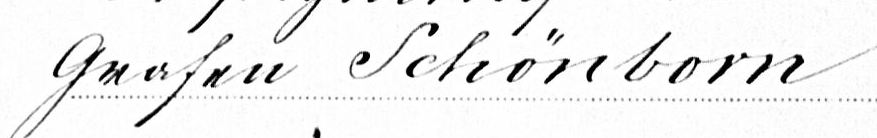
Grafen Schönborn
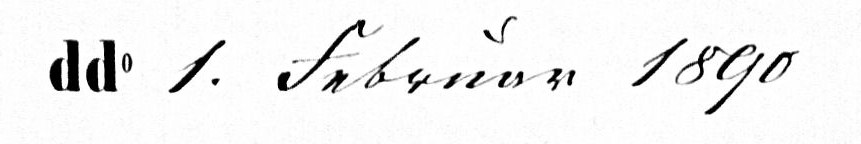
dd° 1. Februar 1890
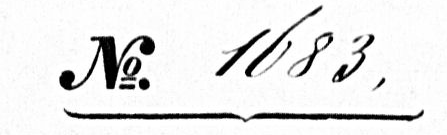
N° 1683.
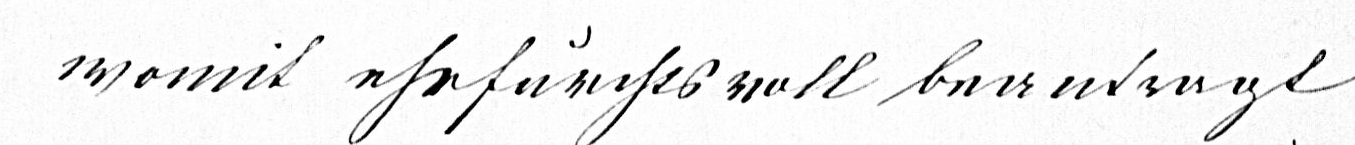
womit ehrfurchtsvoll beantragt
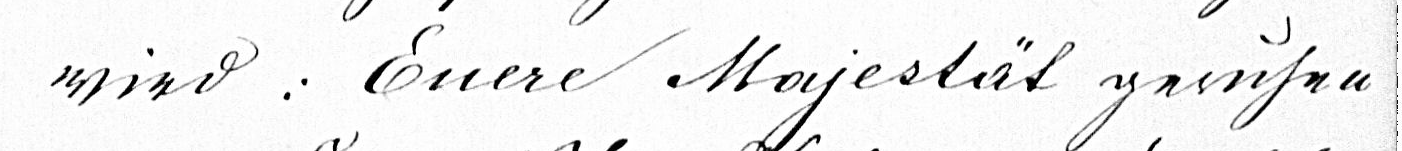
wird: Euere Majestät geruhen
